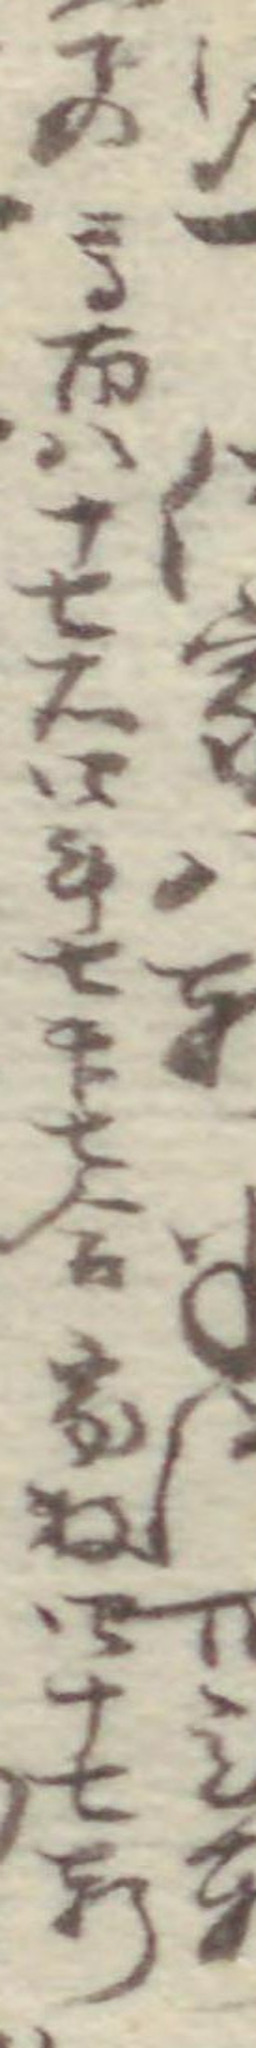高百八十七石四斗七升七合家数四十七軒
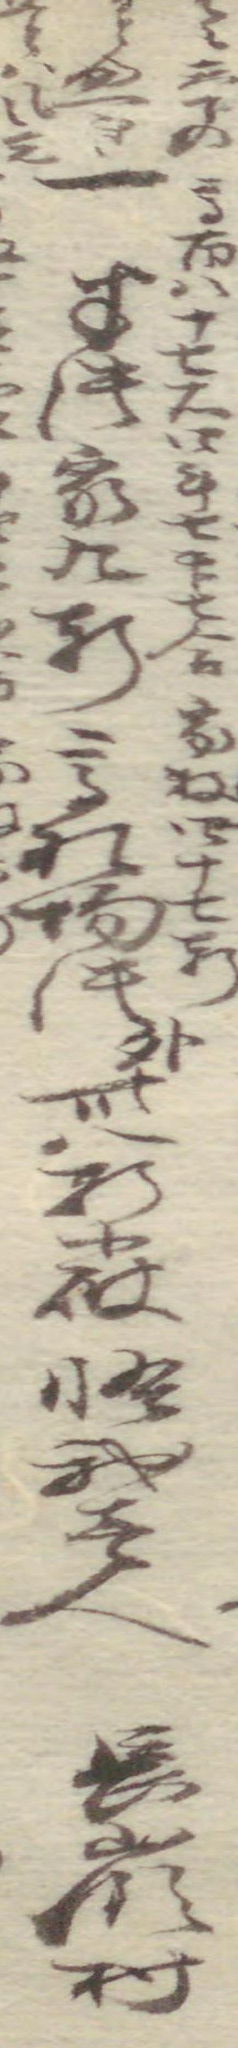一半潰家九軒高札場潰外卅八軒小破怪我壱人長嶺村
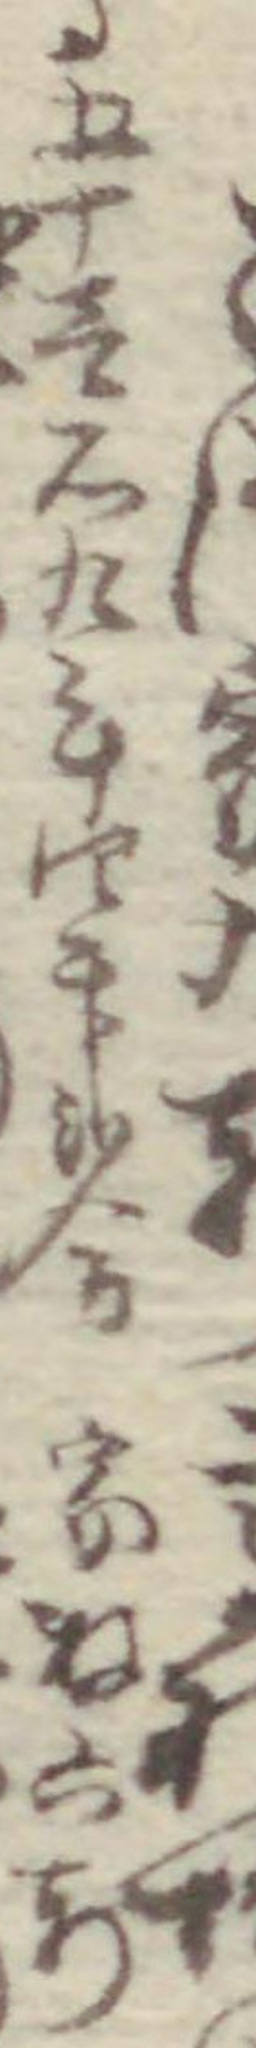高五十壱石九斗四升弐合家数六軒
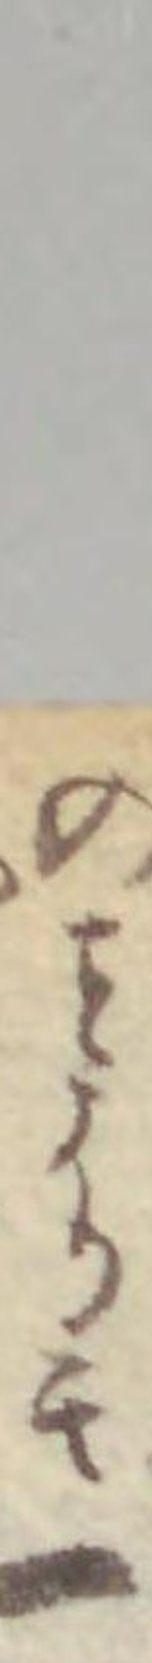のことより其
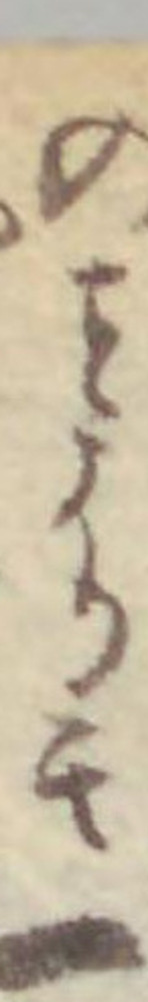のことより其
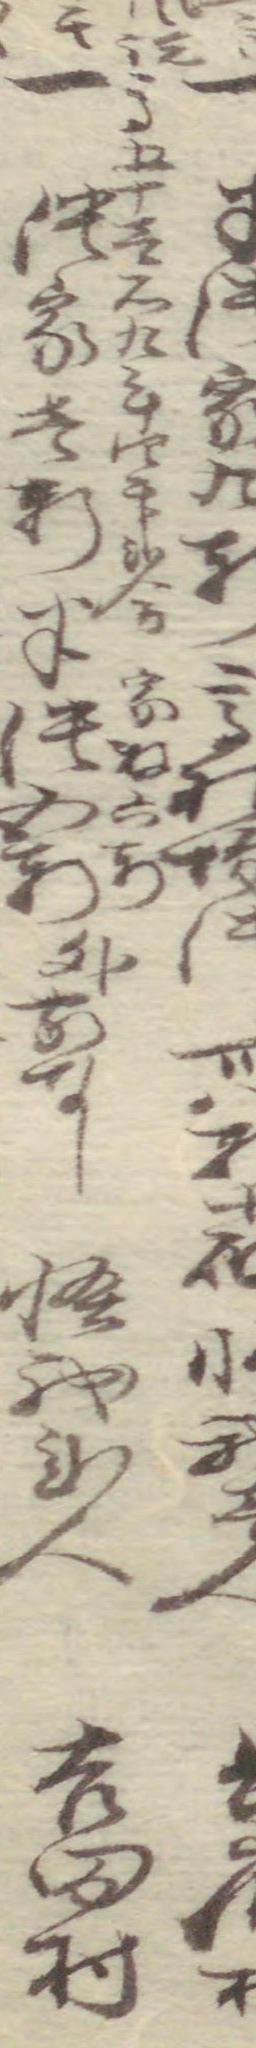一潰家壱軒半潰五軒外家なし怪我弐人吉田村
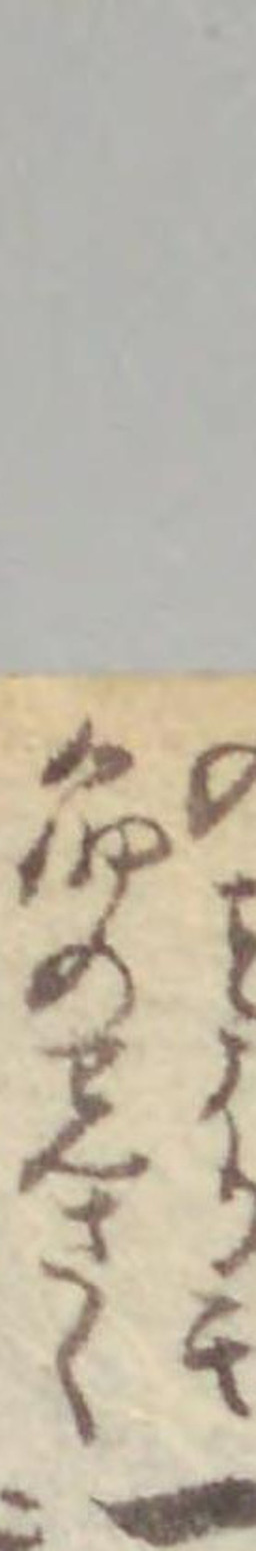筋のせんさく
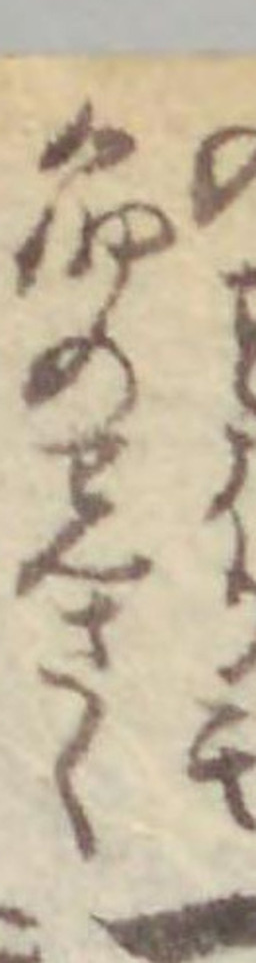筋のせんさく
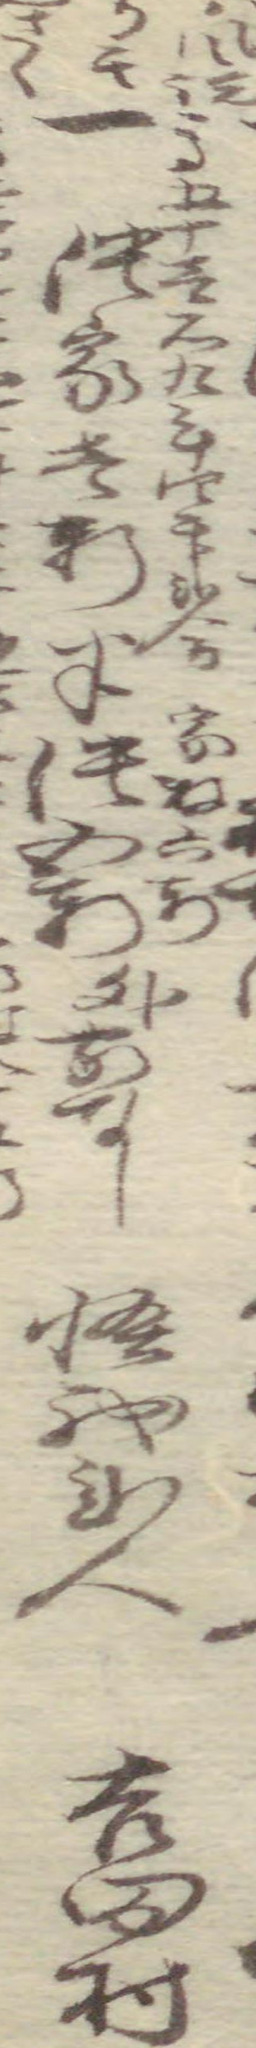一潰家壱軒半潰五軒外家なし怪我弐人吉田村
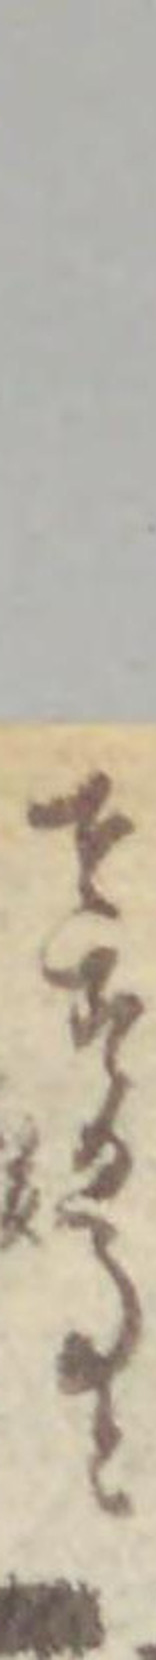をする事と
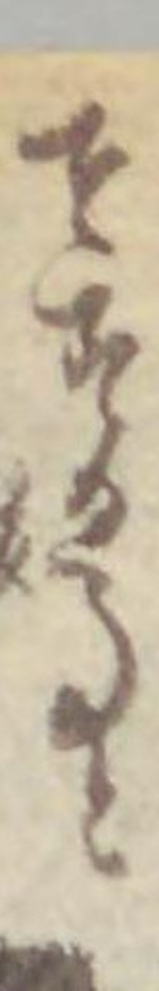をする事と
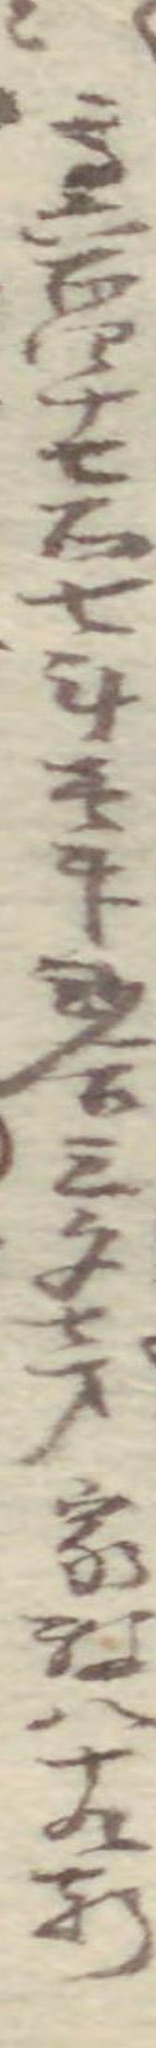高六百四十七石七斗壱升弐合三勺七才家数八十九軒
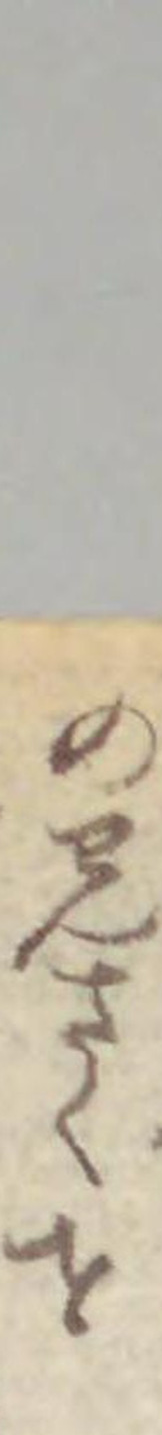のせんさくを
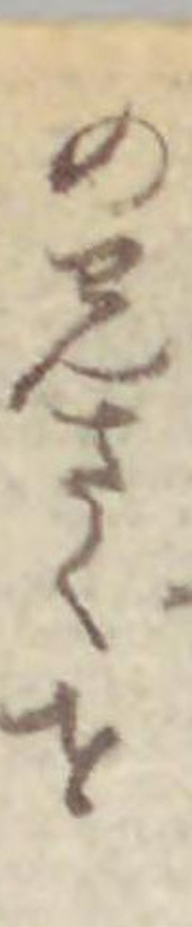のせんさくを
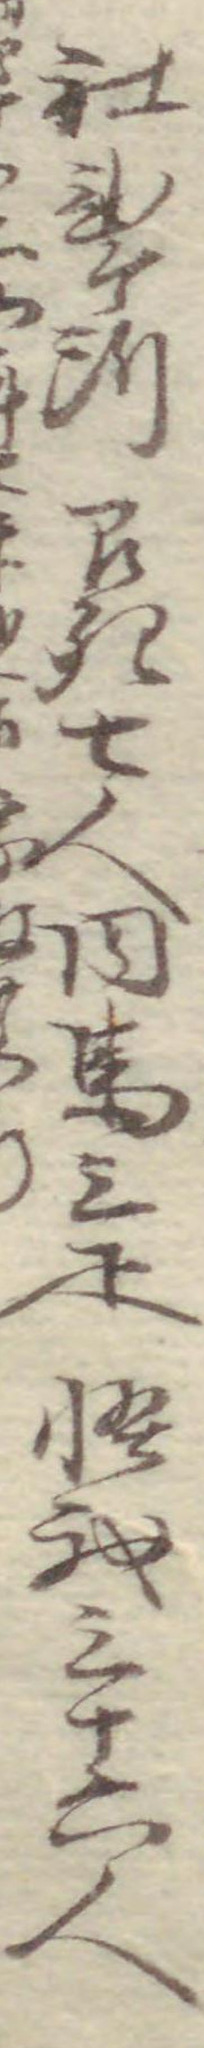社弐ケ所即死七人同馬三疋怪我三十六人
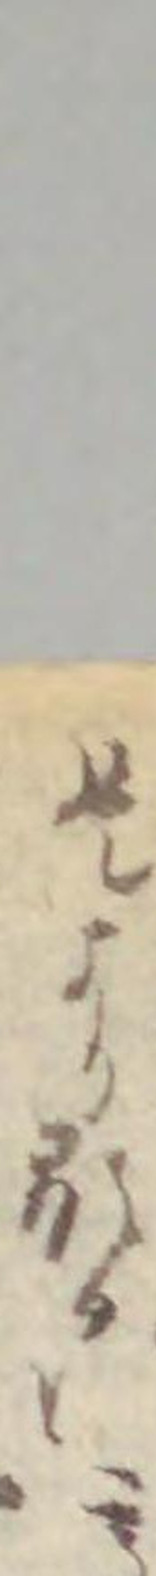是より顕ると
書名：鶯宿雑記. 巻199-200
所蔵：国立国会図書館 National Diet Library, JAPAN
